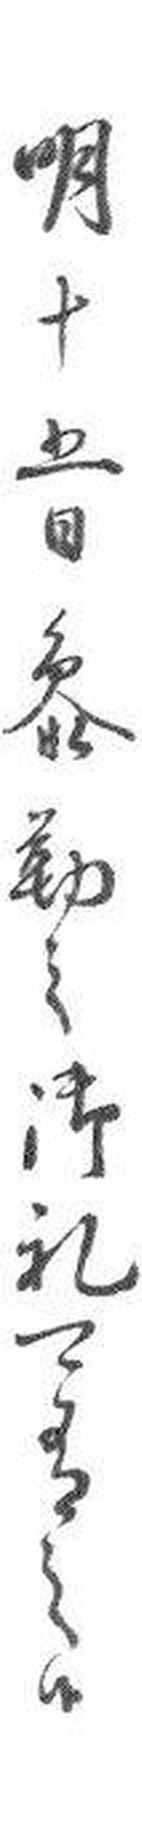明十五日参勤之御礼可有之候
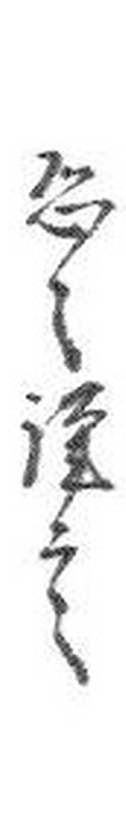恐々謹言
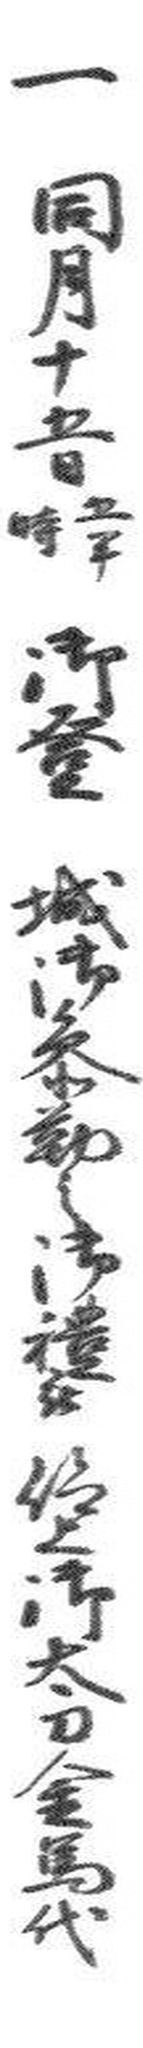一同月十五日五半時御登城御参勤之御礼被仰上御太刀金馬代
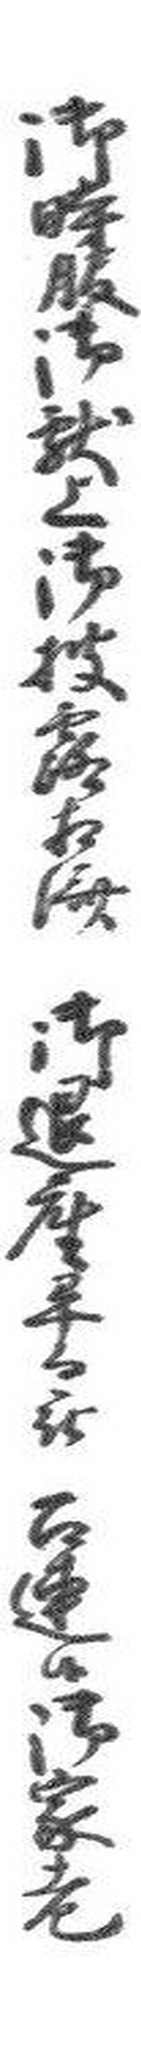御時服御献上御披露相済御退座畢而被召連候御家老
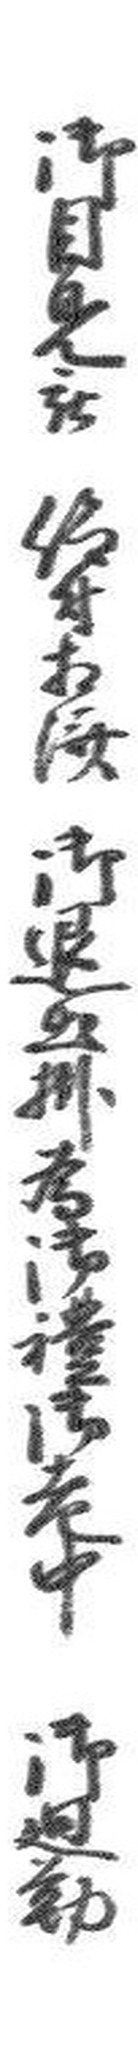御目見被仰付相済御退出掛為御礼御老中御廻勤
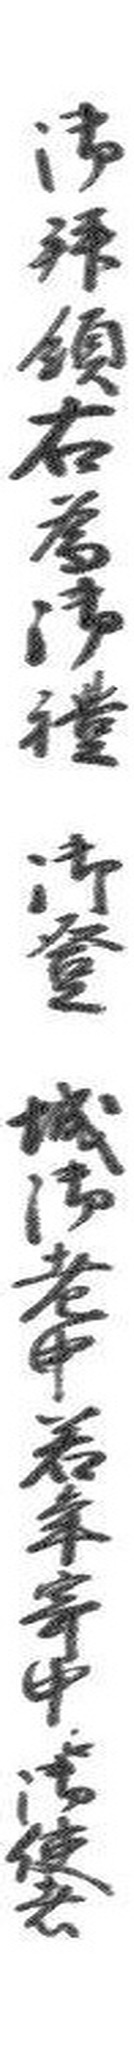御拝領右為御礼御登城御老中若年寄中江御使者
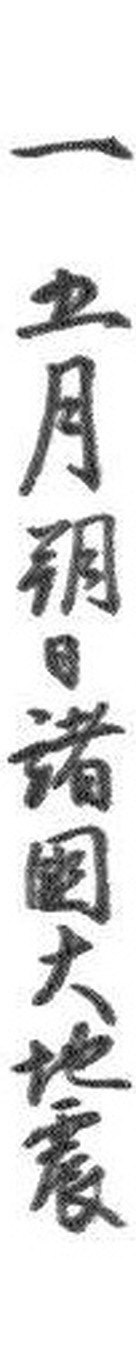一五月朔日諸国大地震

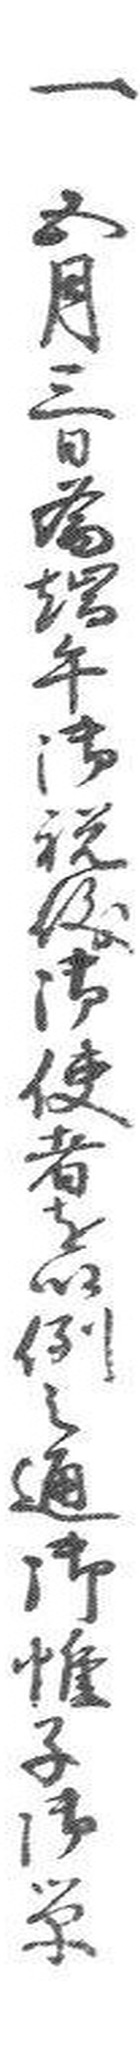一五月三日為端午御祝儀御使者を以例之通御帷子御単
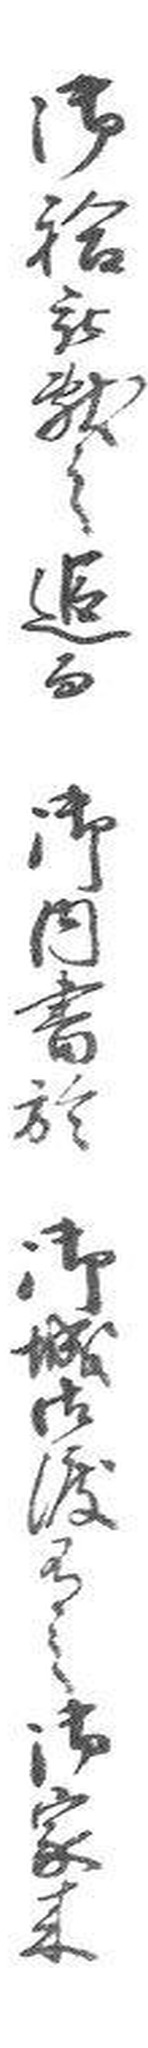御袷被献之追而御内書於御城御渡有之御家来
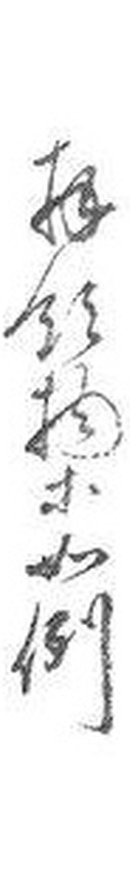拝領物等如例
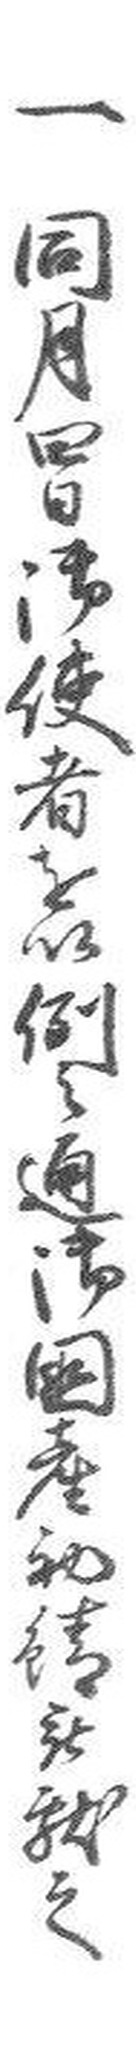一同月四日御使者を以例之通御国産初鯖被献之
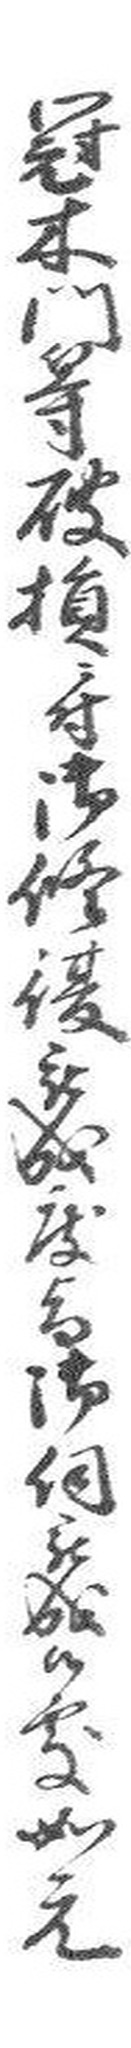冠木門等破損ニ付御修復被成度旨御伺被成候処如元
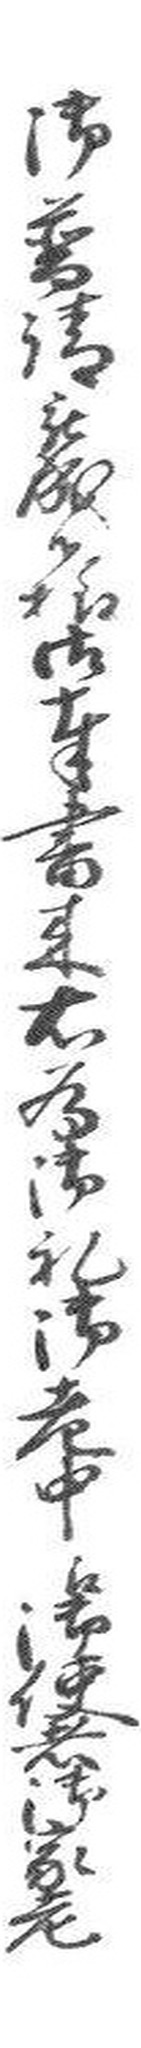御普請御被成候様御奉書来右為御礼御老中江御使者御家老
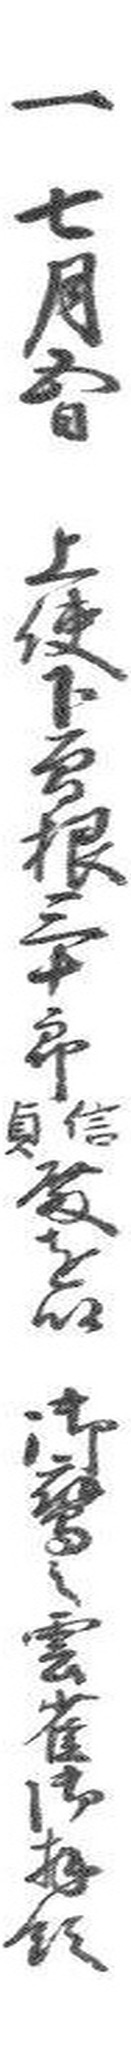一七月五日上使下曾根三十郎信貞殿を以御鷹之雲雀御拝領
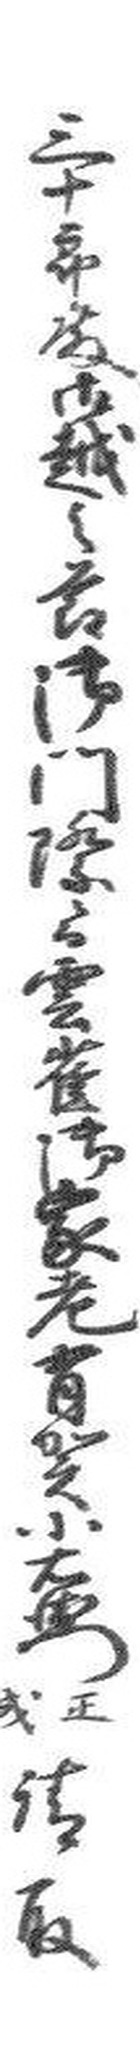三十郎殿御越之節御門際ニ而雲雀御家老有賀小右衛門正成請取
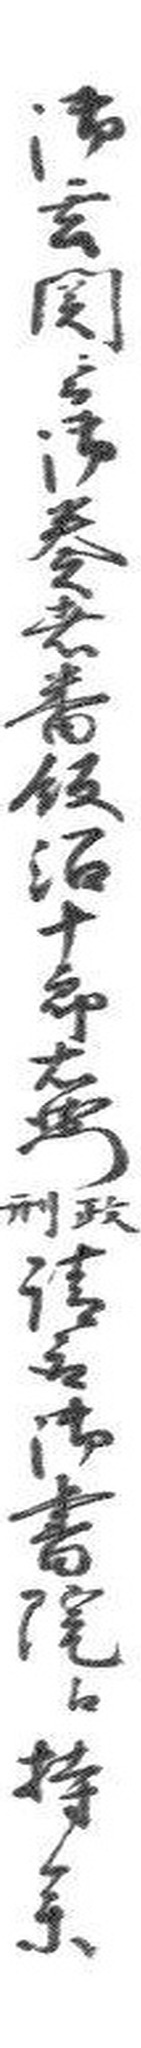御玄関ニ而御奏者番飯沼十郎右衛門政刑請取御書院江持参
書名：家譜 六 光通公 従万治三年到寛文三年
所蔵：福井県文書館 Fukui Prefectural Archives
